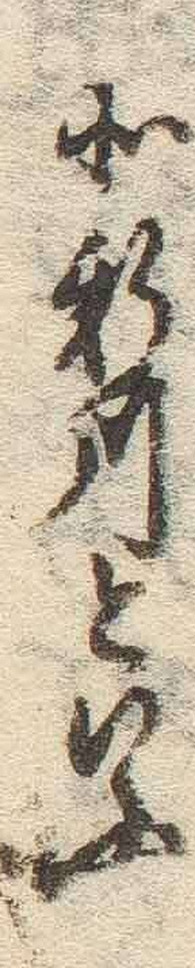北新川といふ
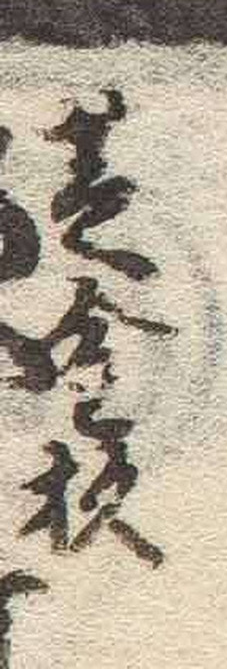芝金杉
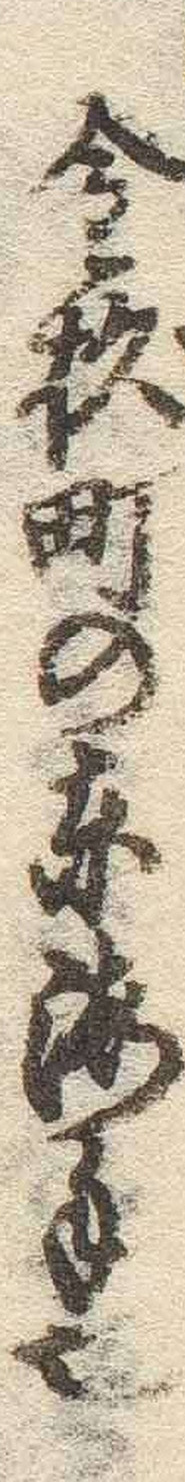金杉町の東海手也
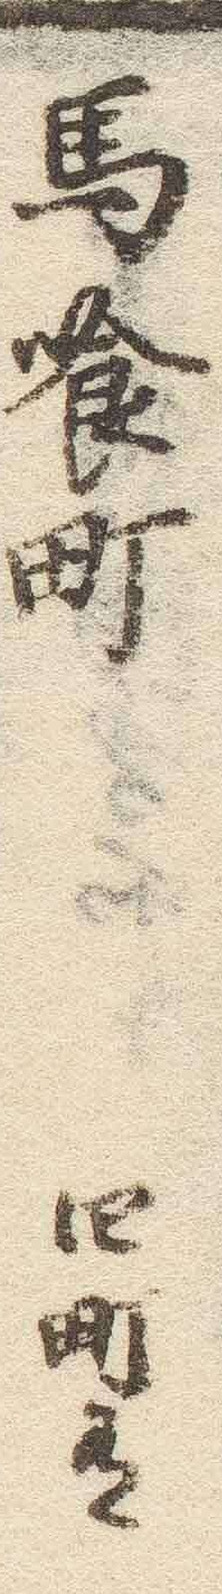馬喰町四町有
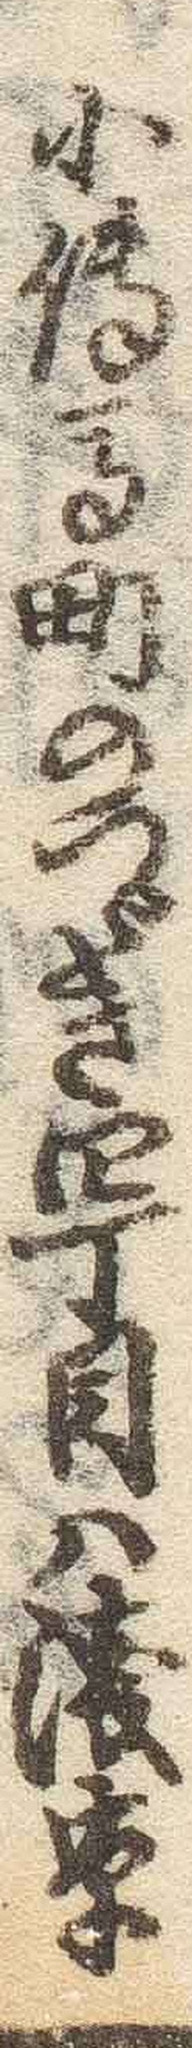小伝馬町のつゞき四丁目は浅草
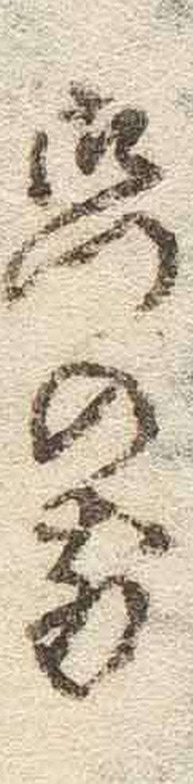御門の前
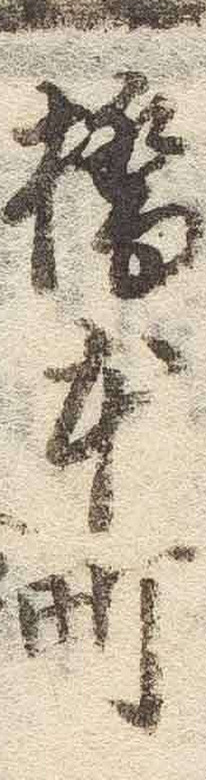橋本町
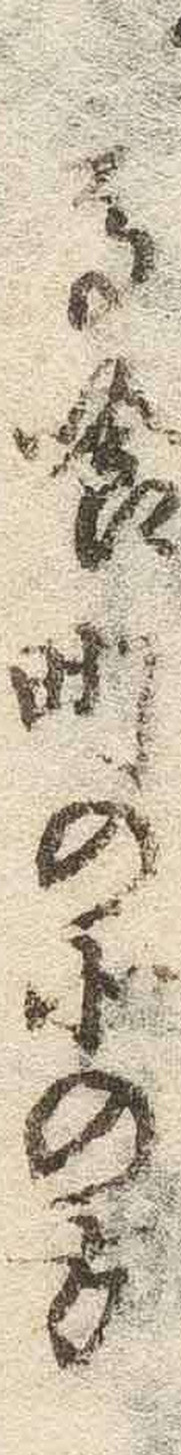馬喰町の北の方
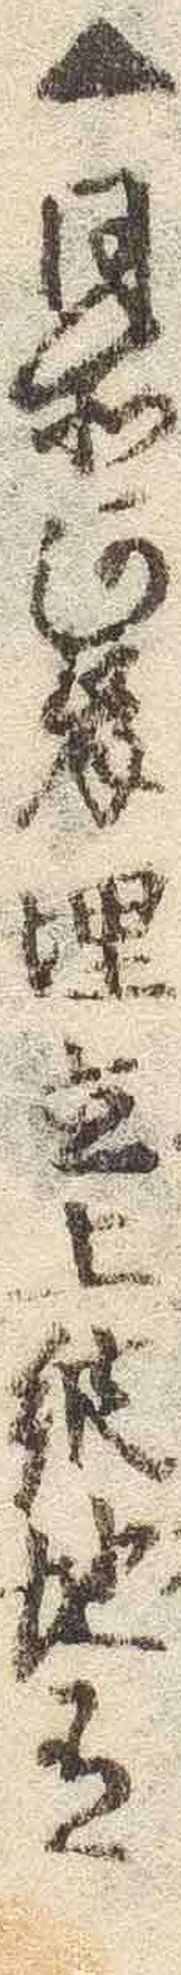▲同所河岸埋立上納地有
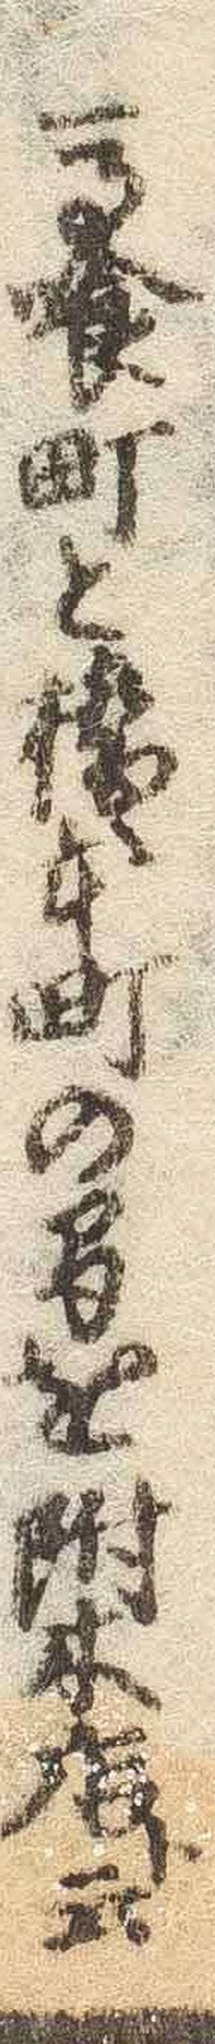馬喰町と橋本町の間を附木店と云
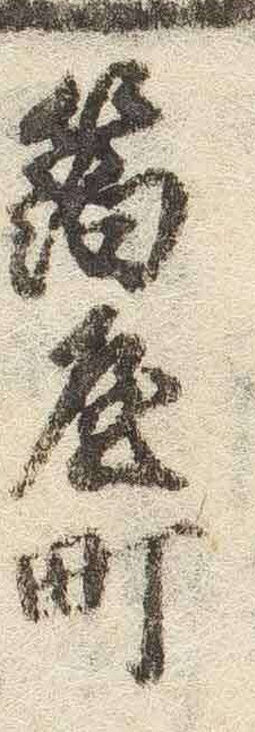箔屋町
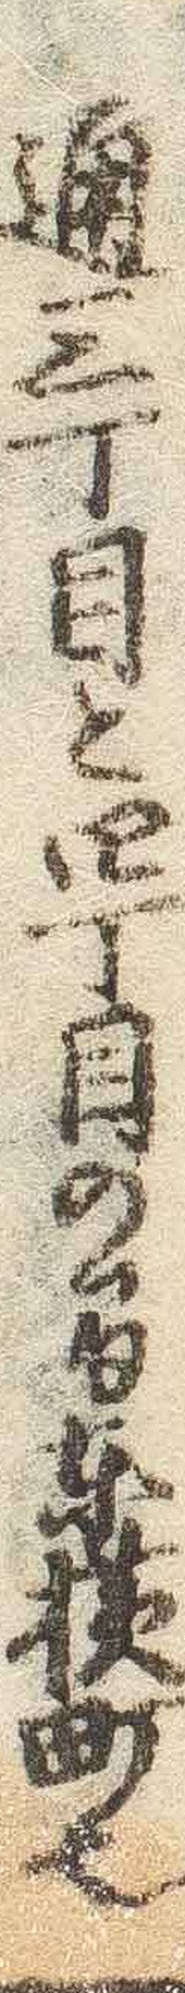通三丁目と四丁目の間東横町也
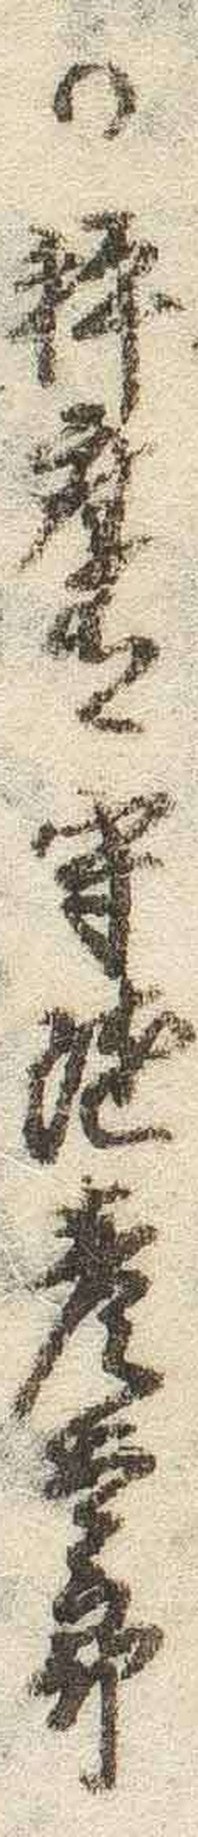◦秤座有守随彦太郎
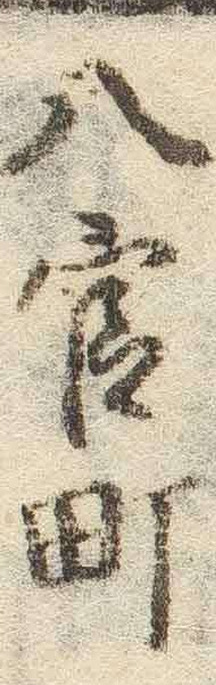八官町
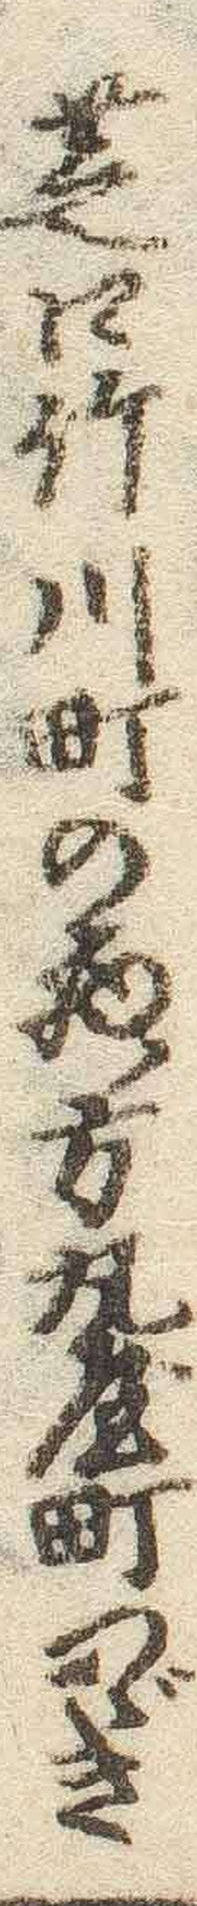芝口竹川町の西の方丸屋町つゞき
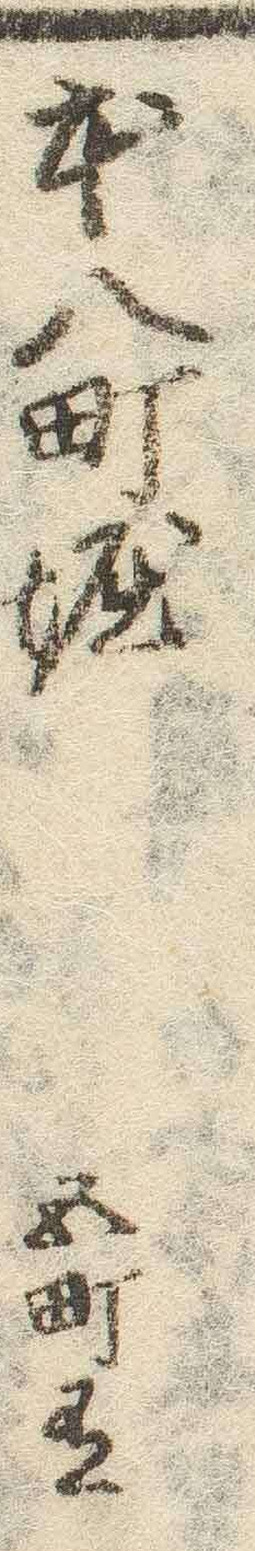本八町堀五町有
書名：江戸町独案内
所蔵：東京学芸大学附属図書館 国文学研究資料館
